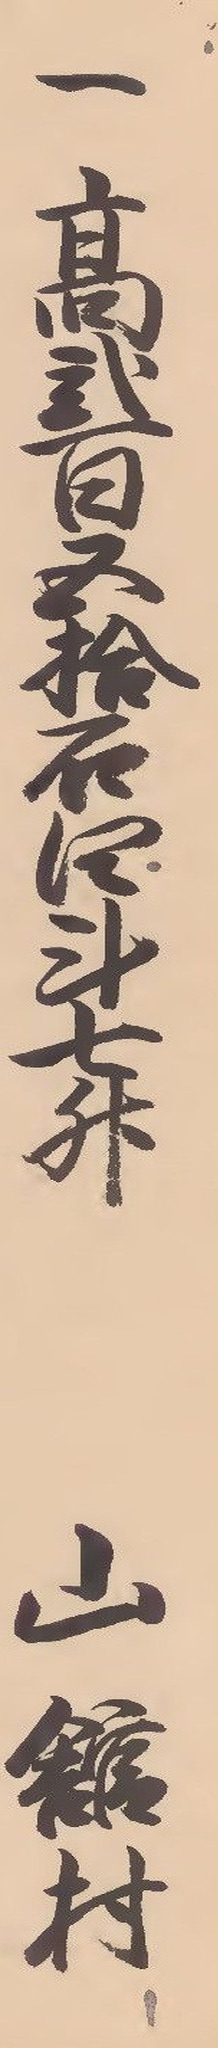一高弐百五拾石四斗七升山館村
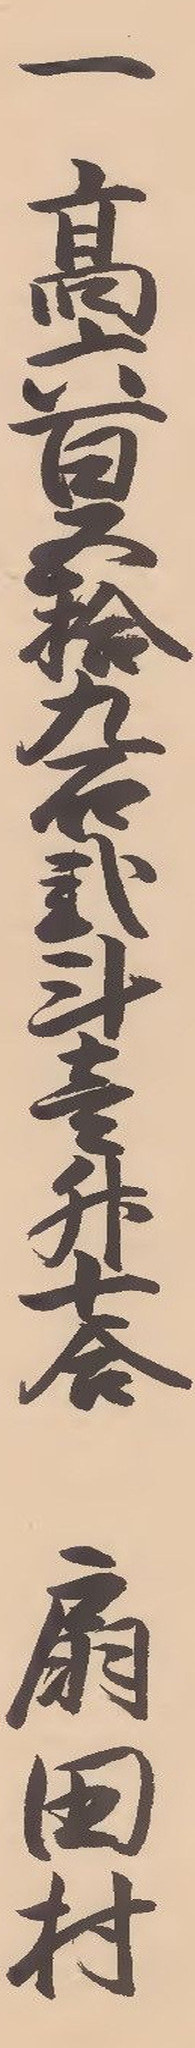一高六百五拾九石弐斗壱升七合扇田村
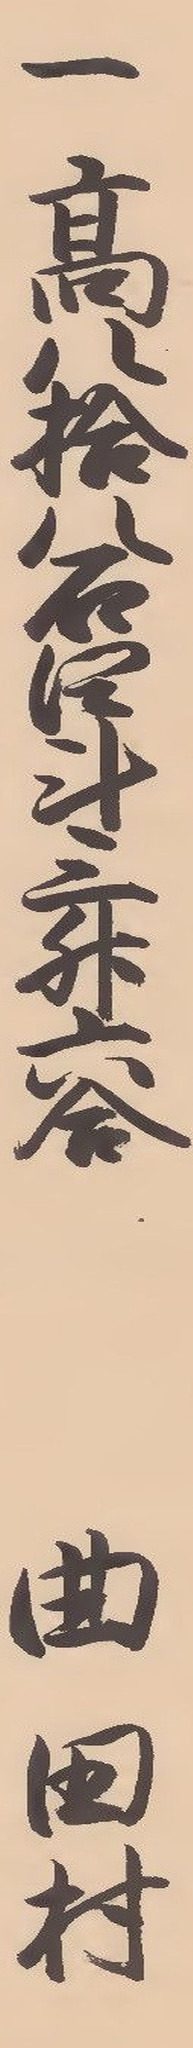一高八拾八石四斗三升六合曲田村
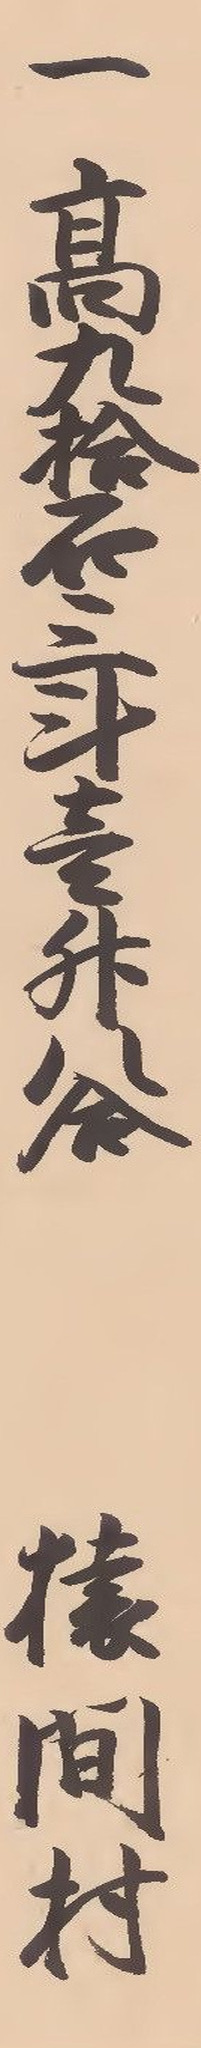一高九拾石三斗壱升八合猿間村
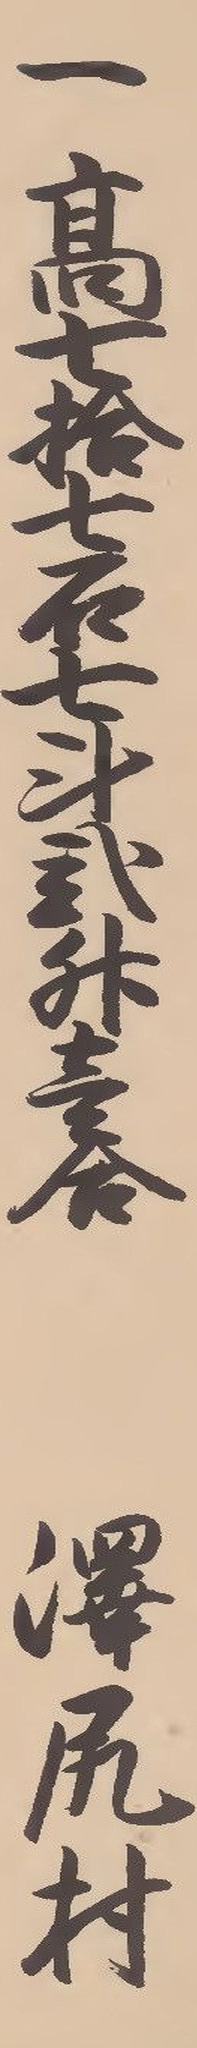一高七拾七石七斗弐升壱合沢尻村
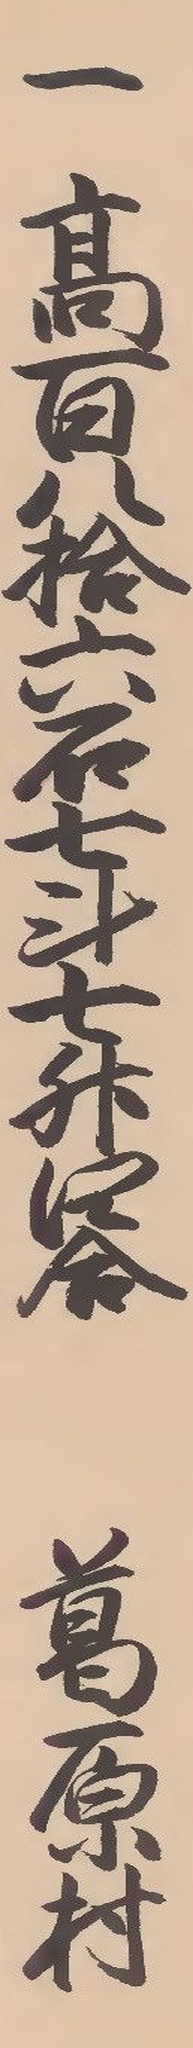一高百八拾六石七斗七升四合葛原村
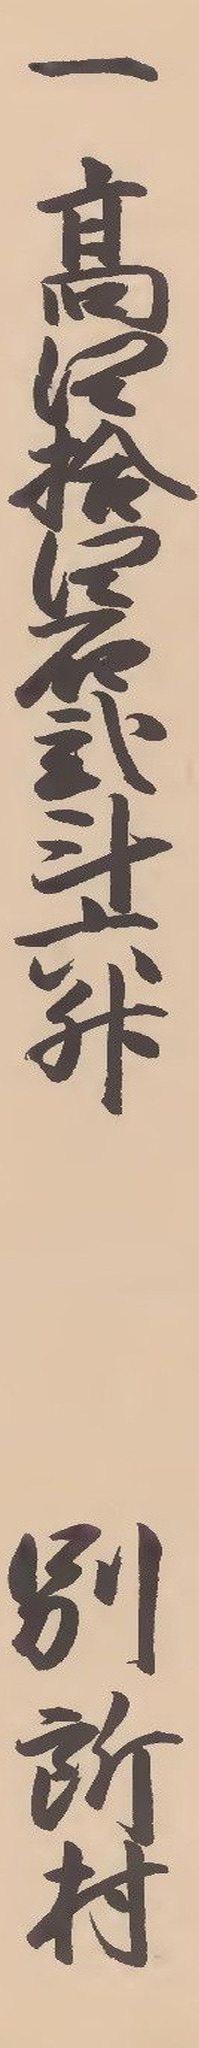一高四拾四石弐斗六升別所村
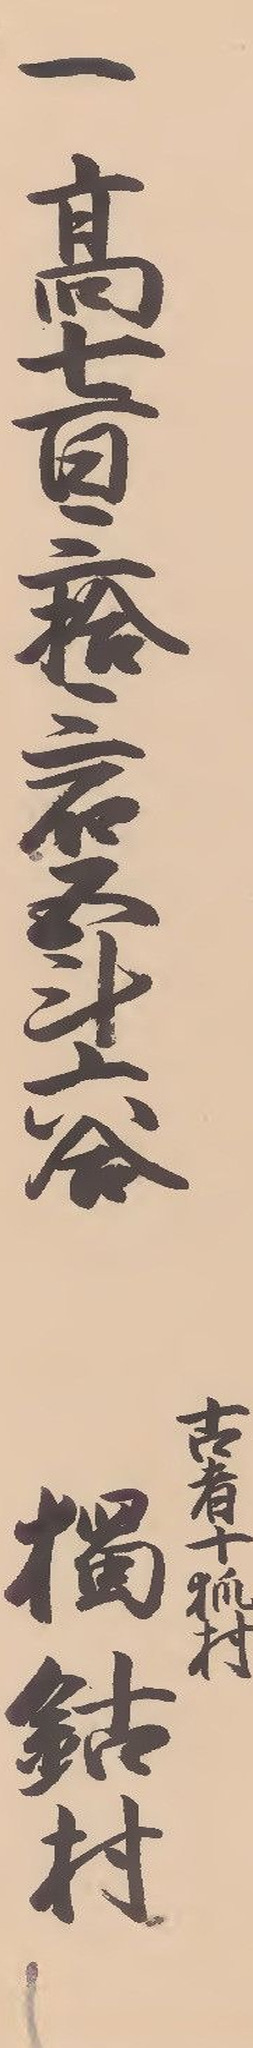一高七百三拾三石五斗六合独鈷村

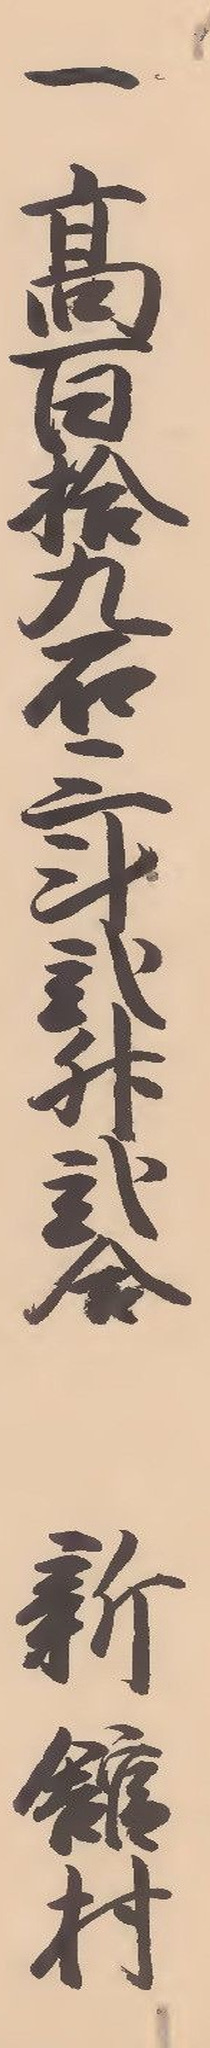一高百拾九石三斗弐升弐合新館村
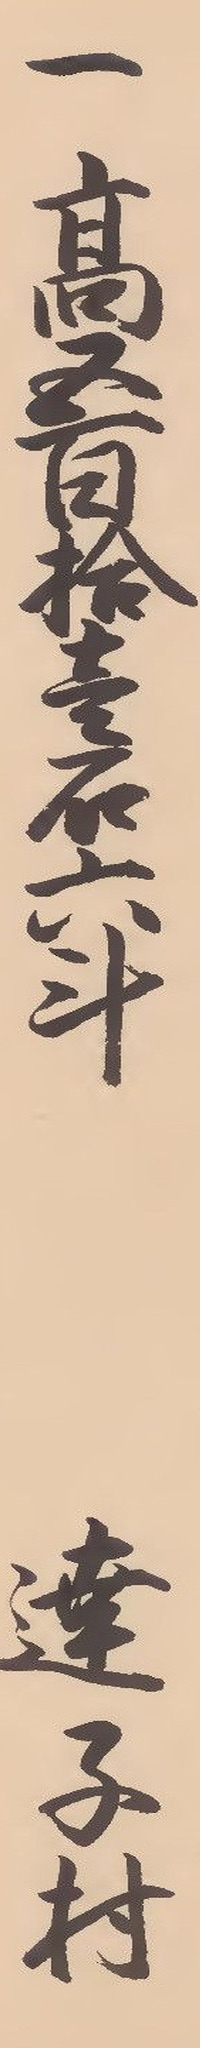一高五百拾壱石六斗達子村
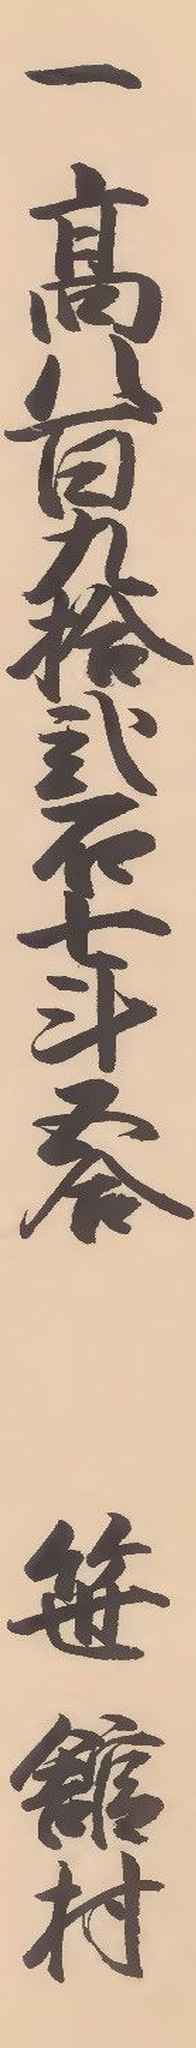一高八百九拾弐石七斗五合笹館村
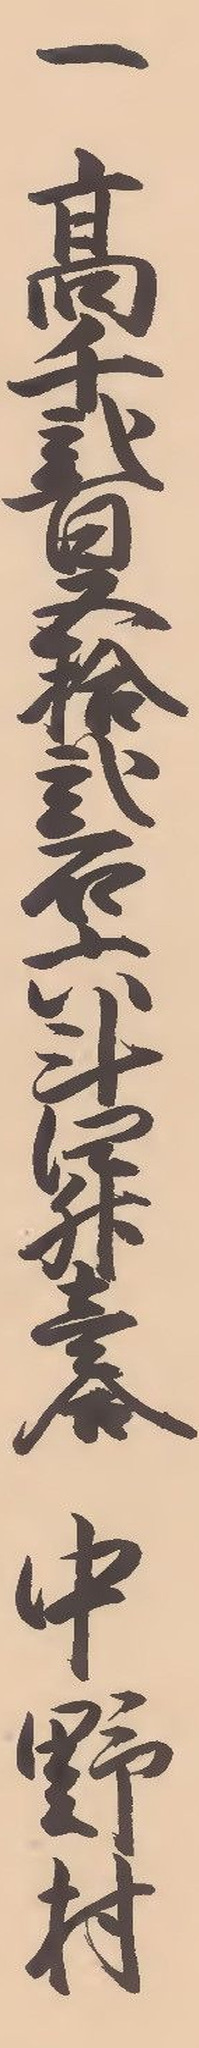一高千弐百五拾弐石六斗四升壱合中野村
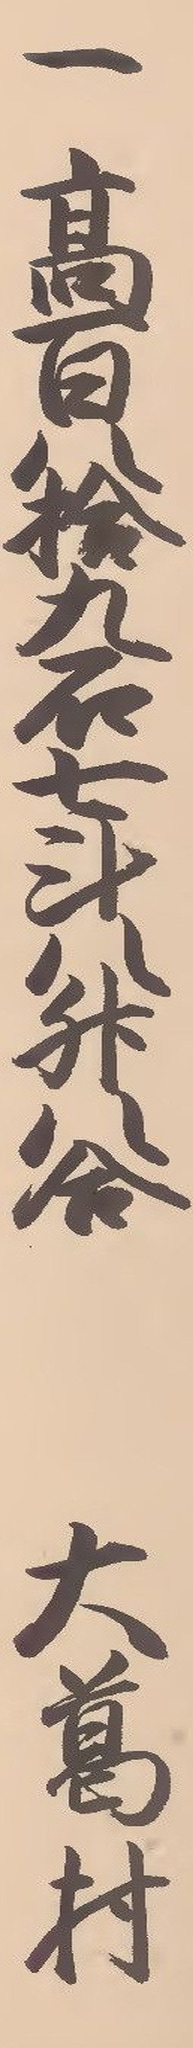一高百八拾九石七斗八升八合大葛村
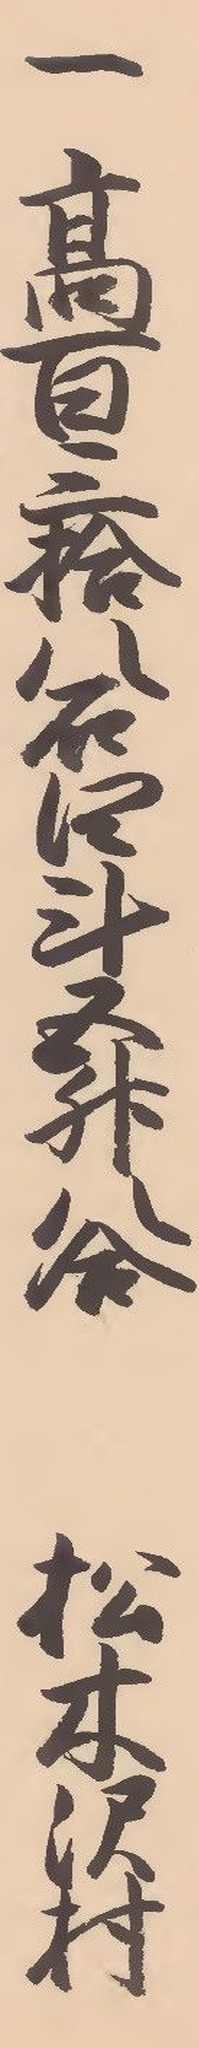一高百三拾八石四斗五升八合松木沢村
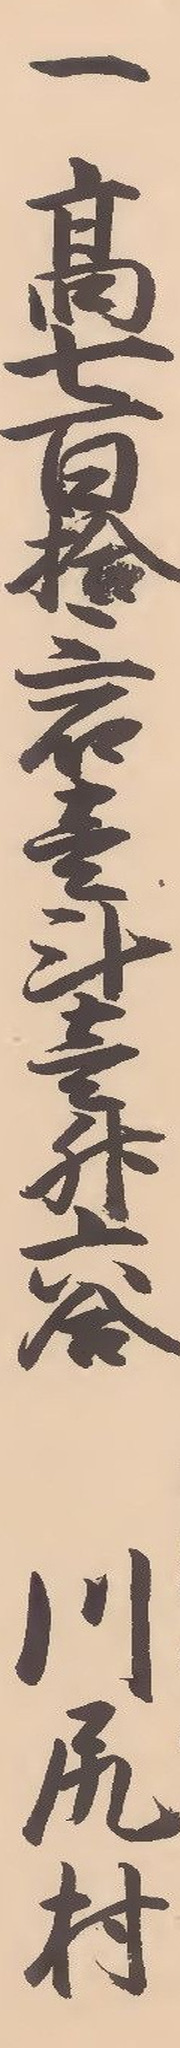一高七百拾三石壱斗壱升六合川尻村
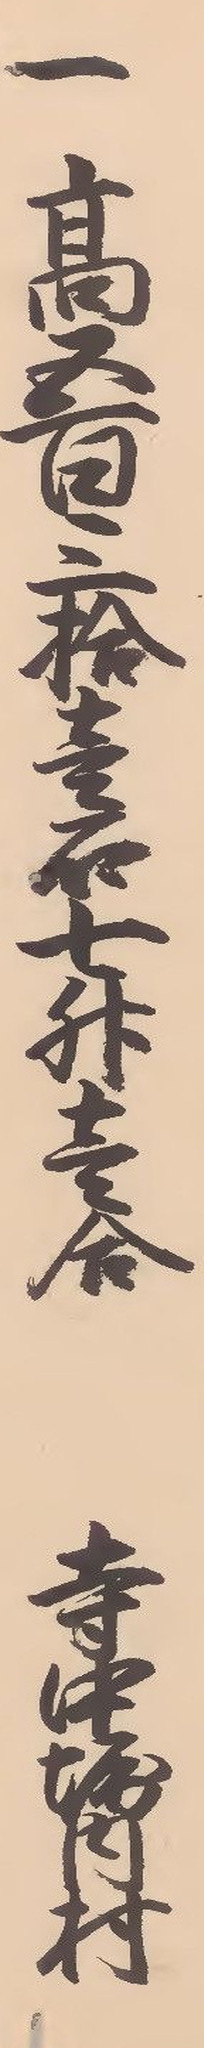一高五百三拾壱石七升壱合寺中堀内村
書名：出羽国郷帳　５
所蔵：国立公文書館 National Archives of Japan
